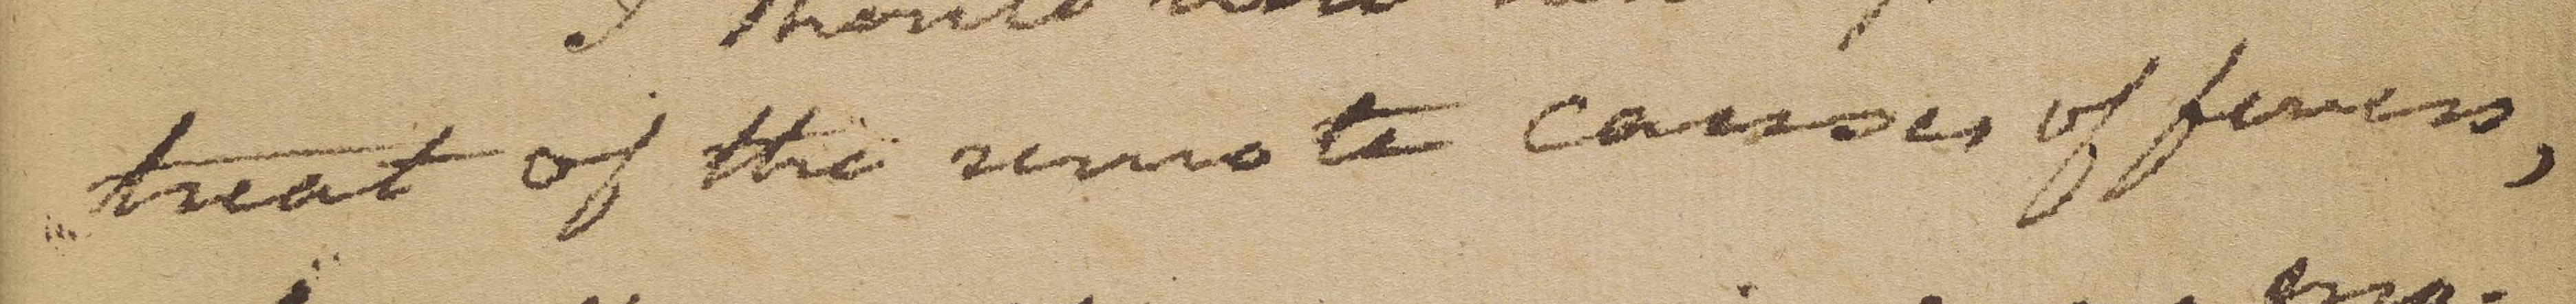treat of the remote causes of fevers,
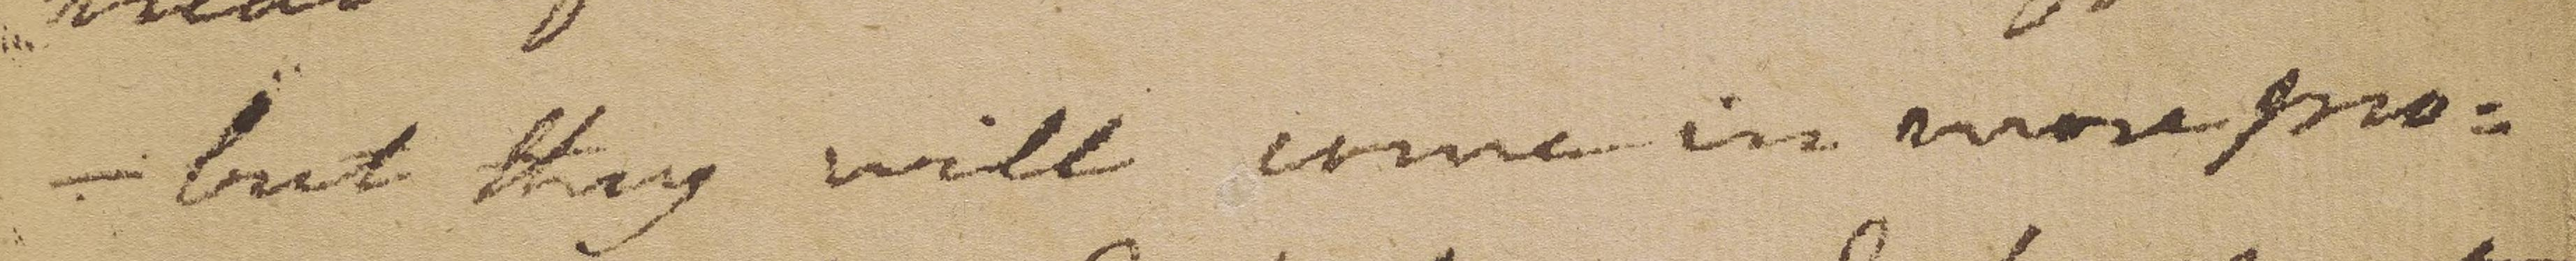- but they will come in more pro-
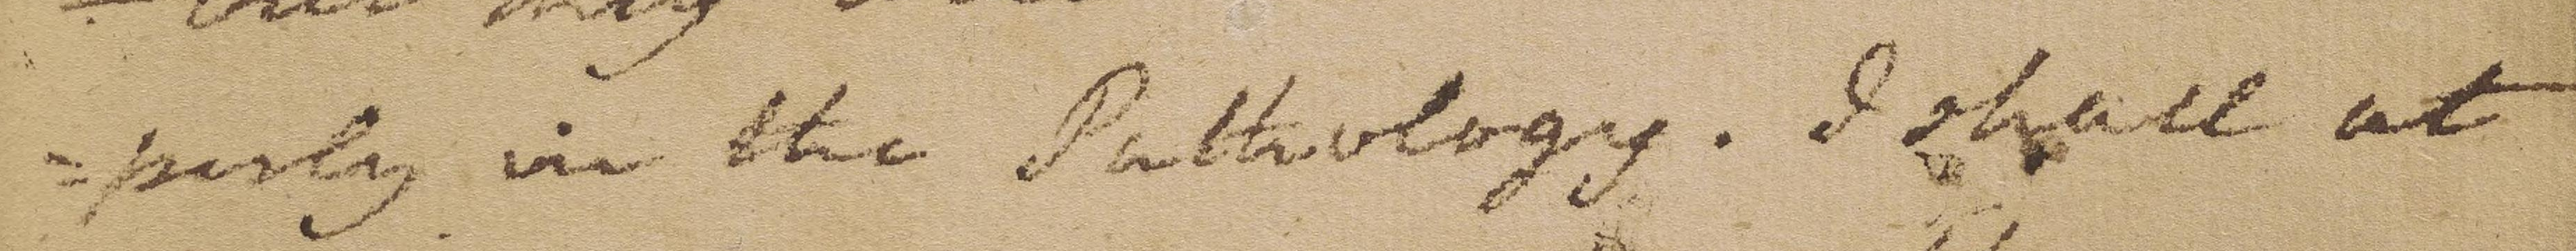-perly in the Pathology. I shall at
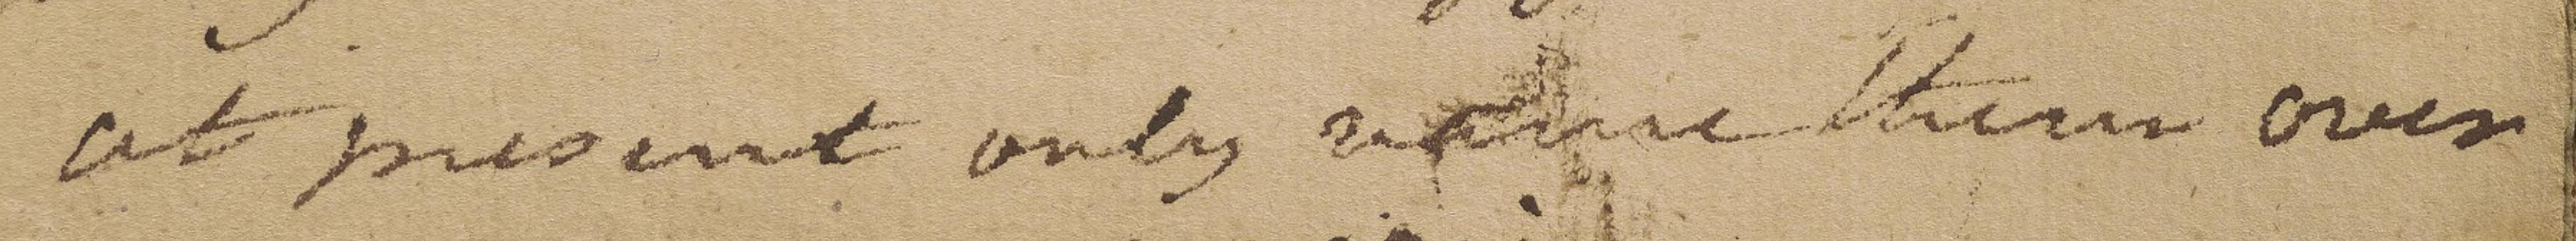at present only where there over
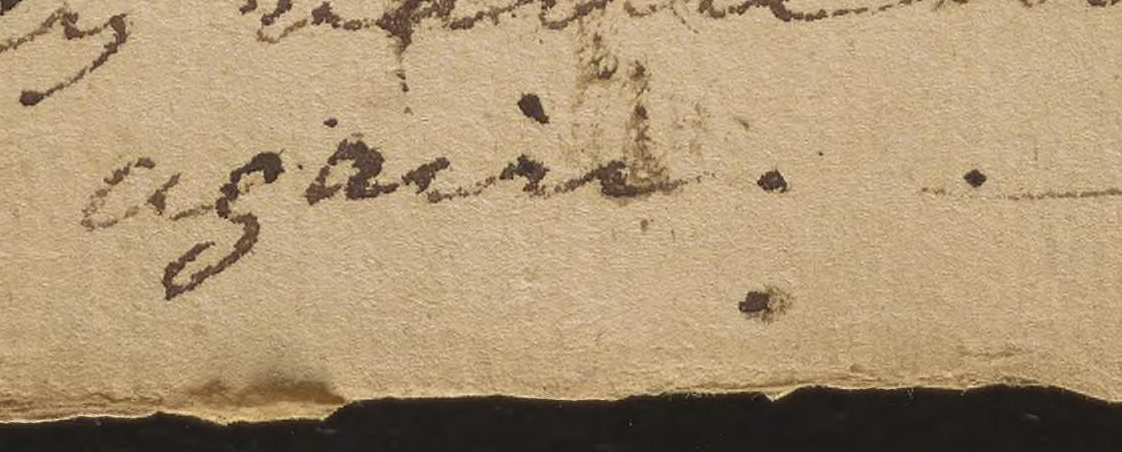again.
